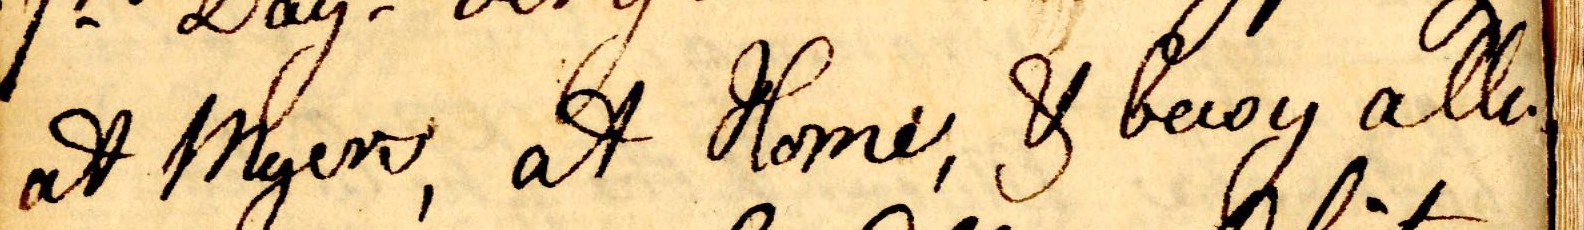at Myers, at Home, & busy all
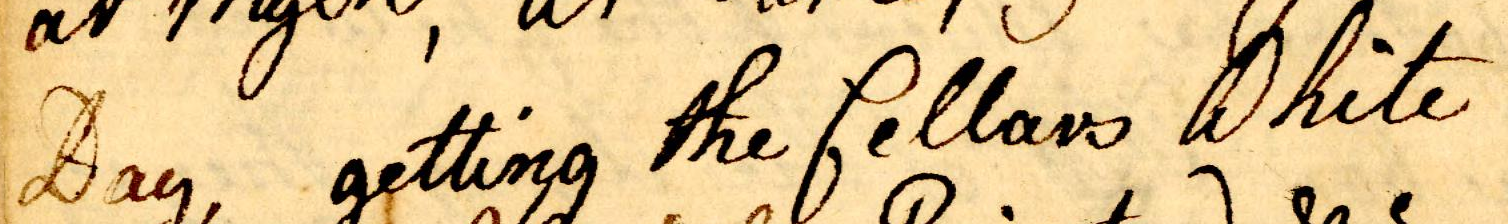Day, getting the Cellars White
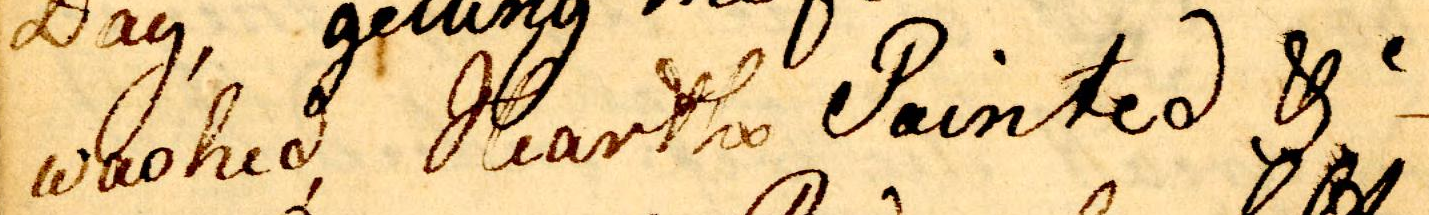washed, Hearths Painted &^c
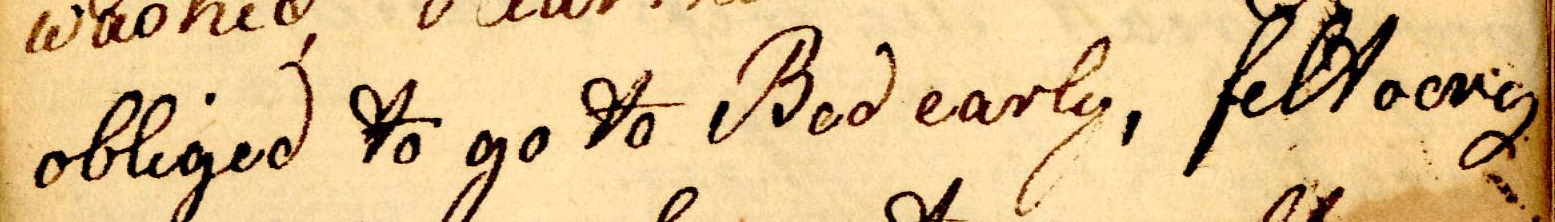obliged to go to Bed early, felt very
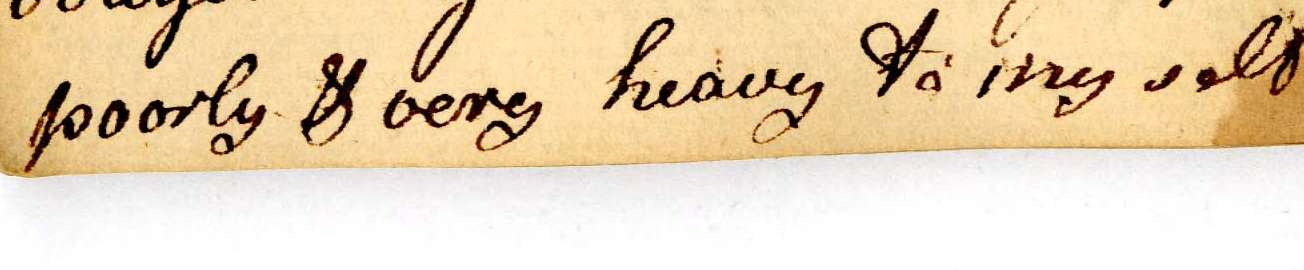poorly & very heavy to myself
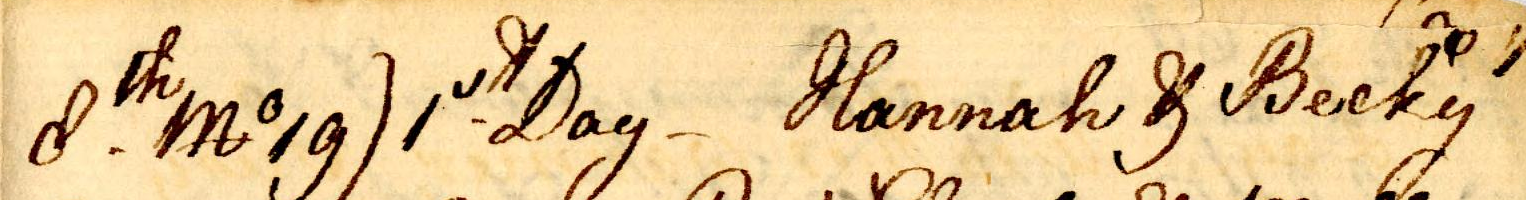8^th M^o 19) 1^st Day- Hannah & Becky
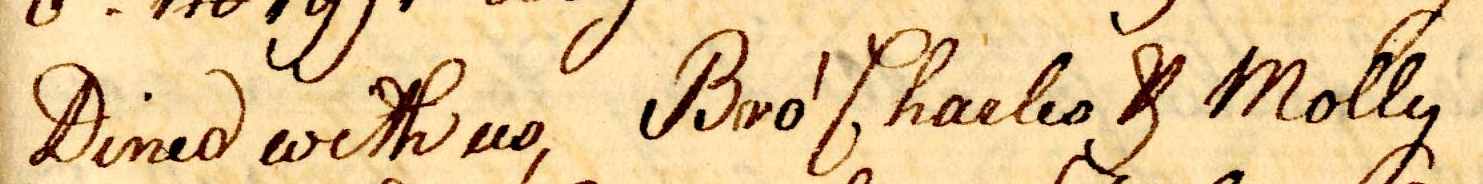Dined with us, Bro' Charles & Molly
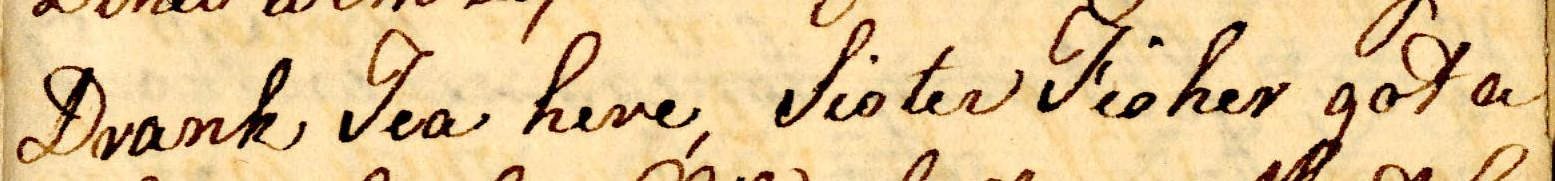Drank Tea here, Sister Fisher got a
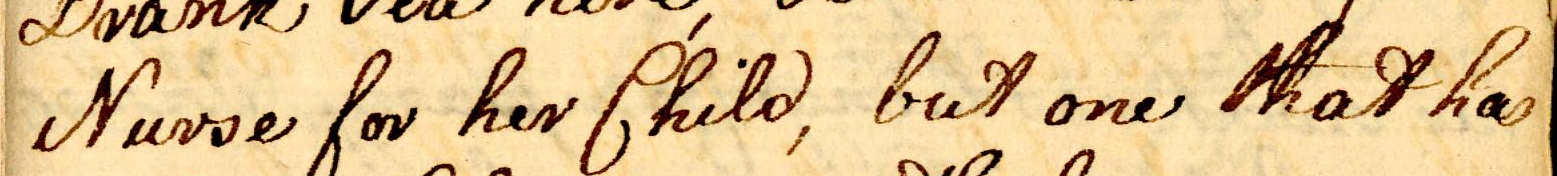Nurse for her Child, but one that has
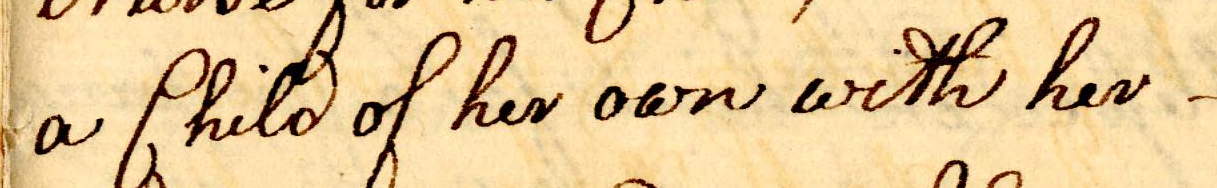a Child of her own with her
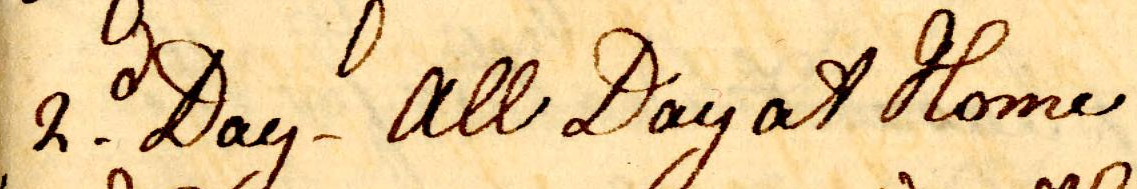2^d. Day- All Day at Home
